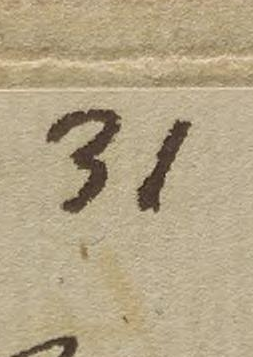31
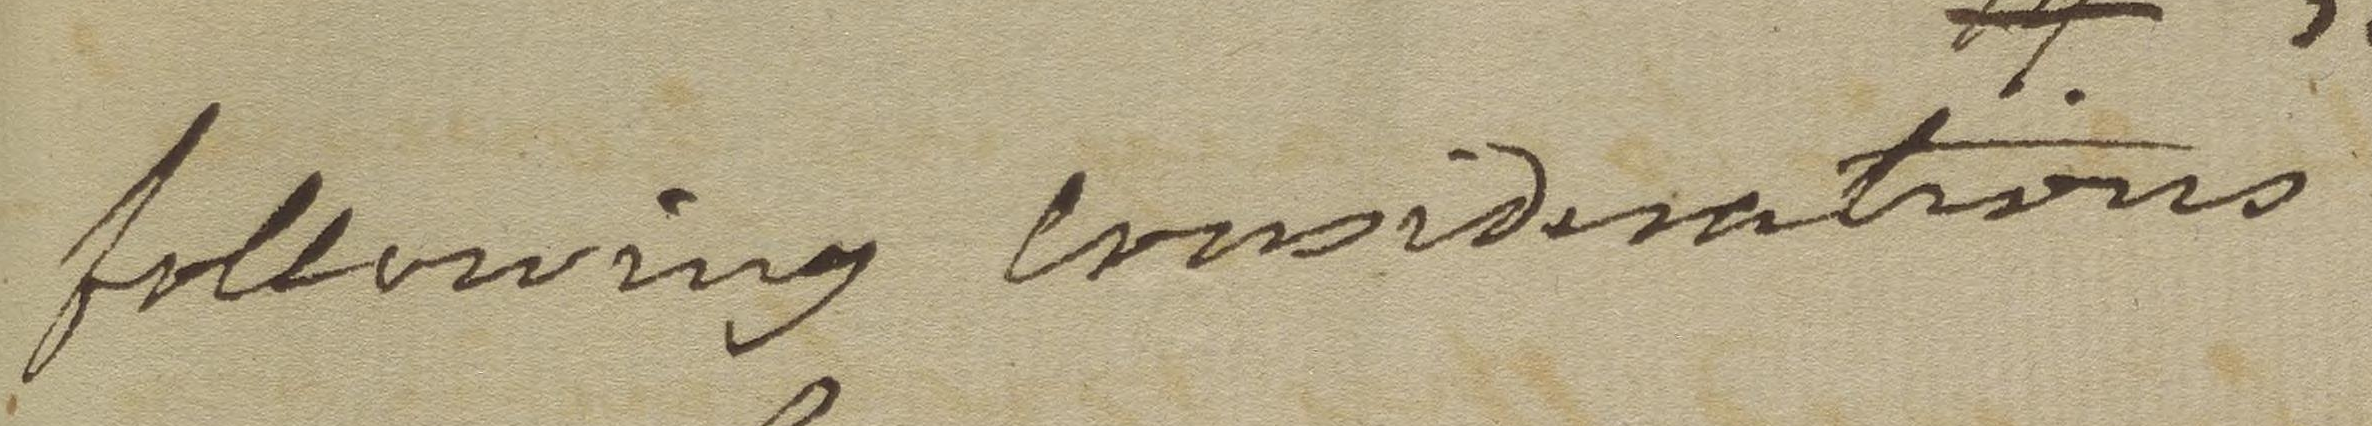following considerations.
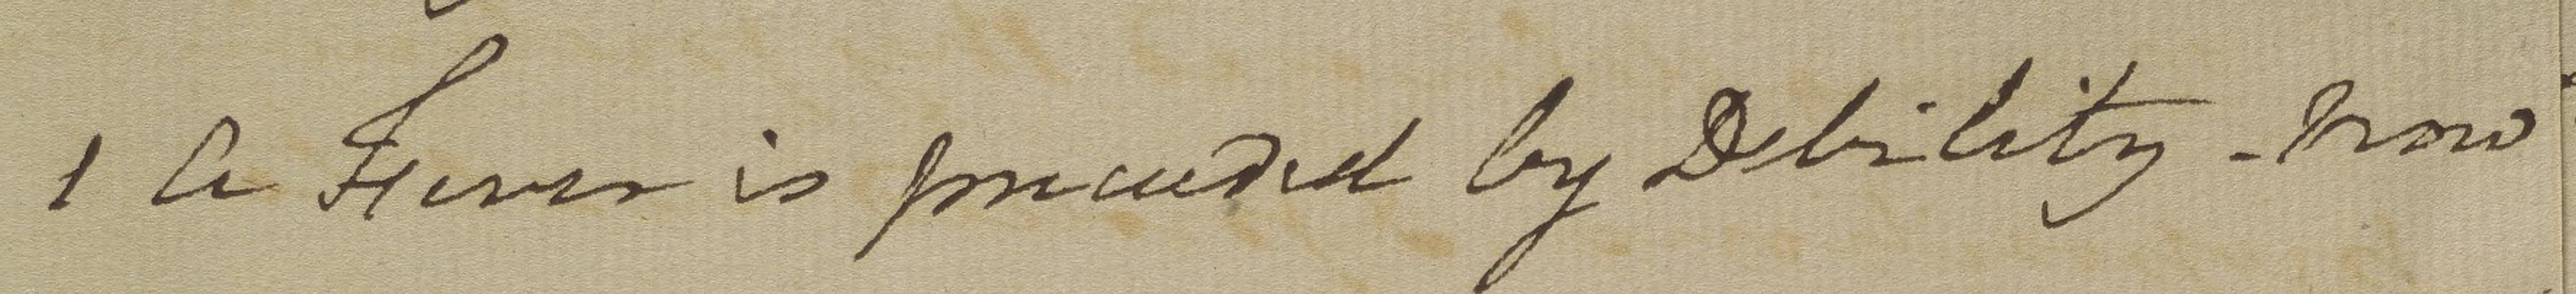1 A Fever is proceeded by debility. now
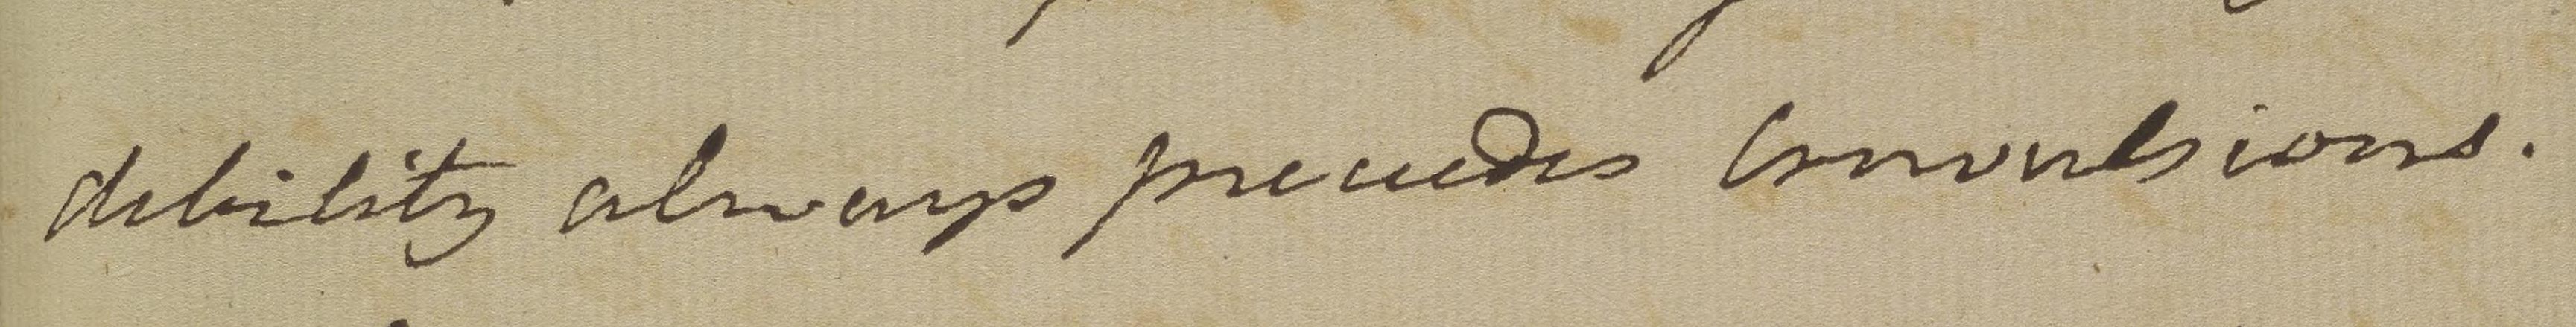debility always precedes convulsions.
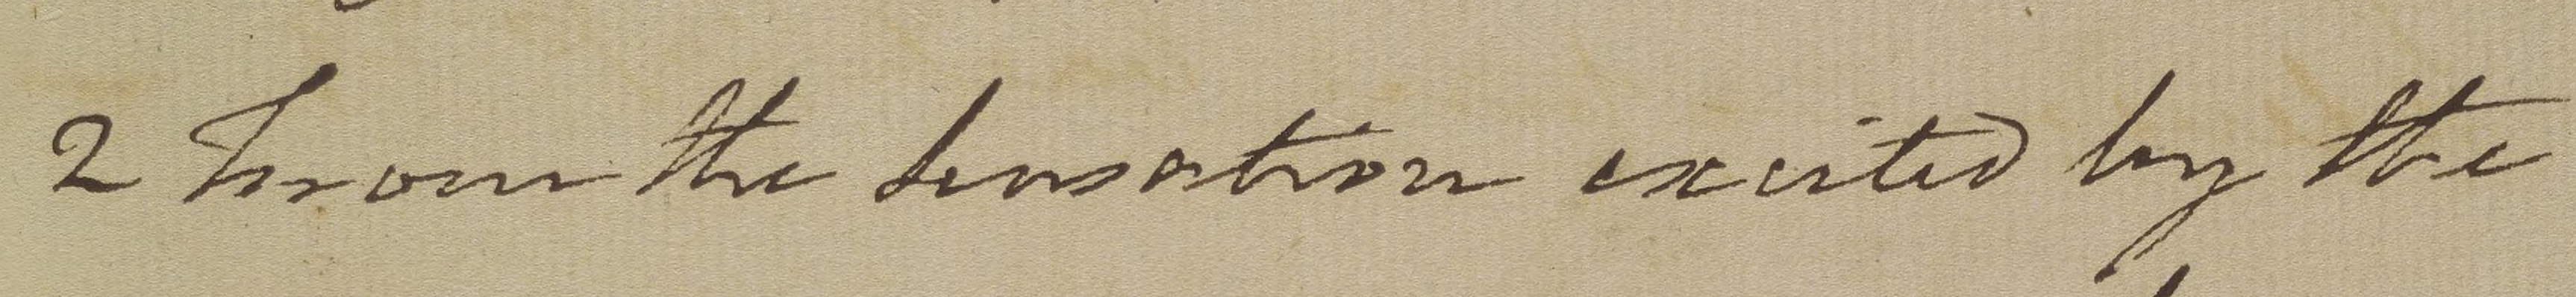2 From the sensation excited by the
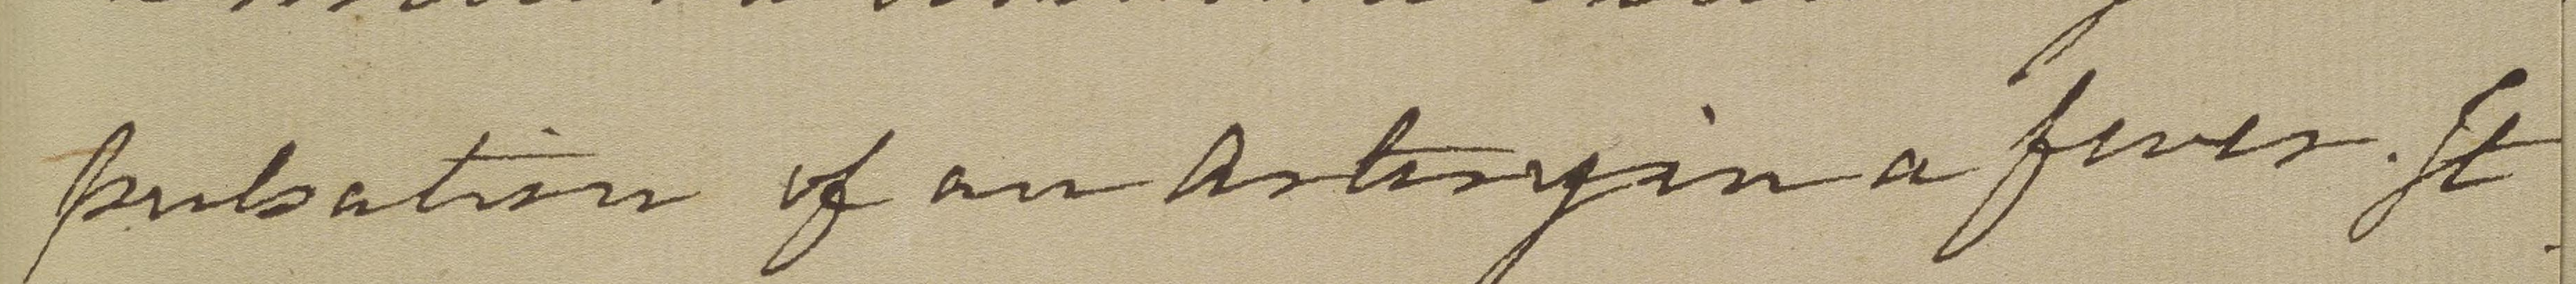pulsation of an artery in a fever. It
